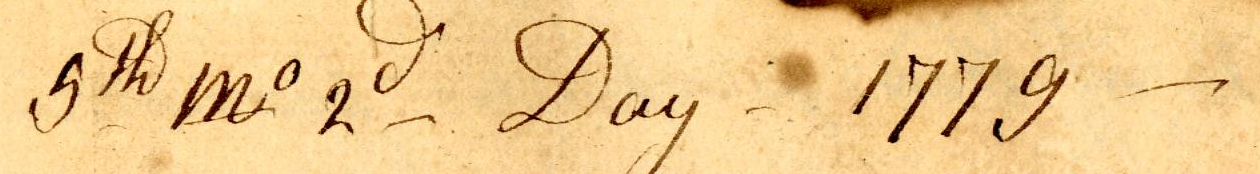5^th M^o 2^d Day- 1779-
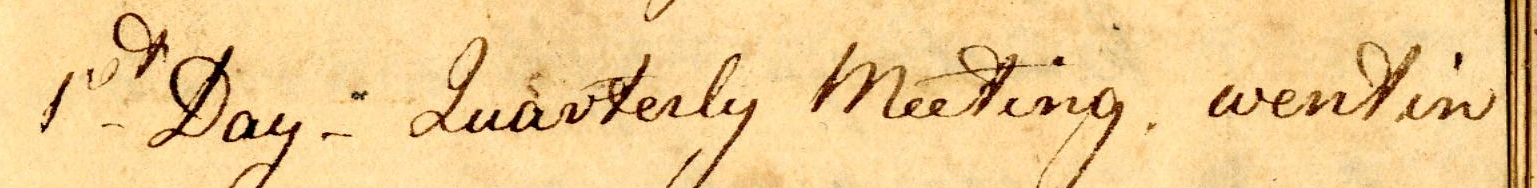1^st Day- Quarterly Meeting went in
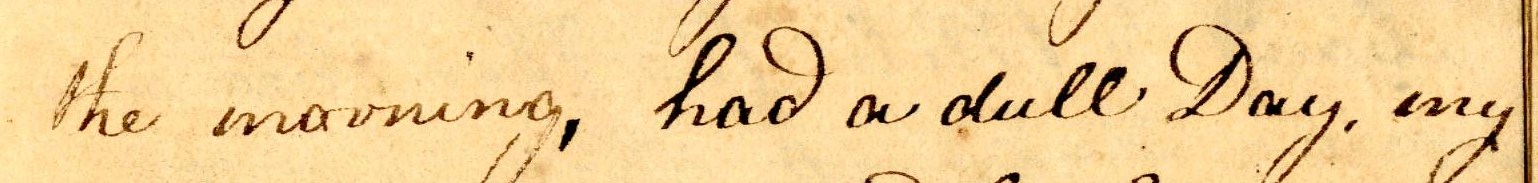the morning, had a dull Day, my
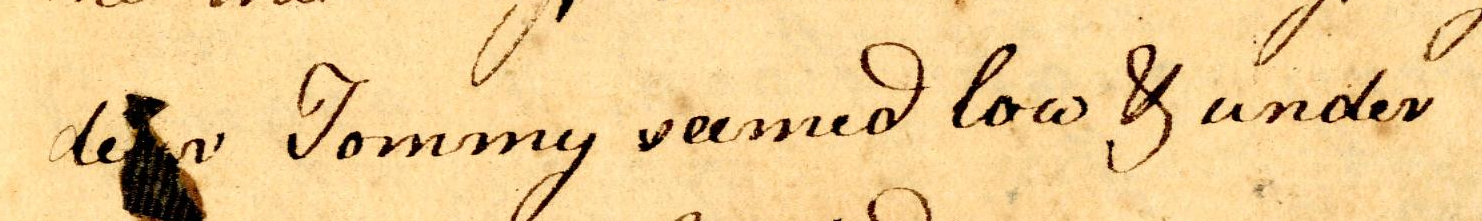dear Tommy seemed low & under
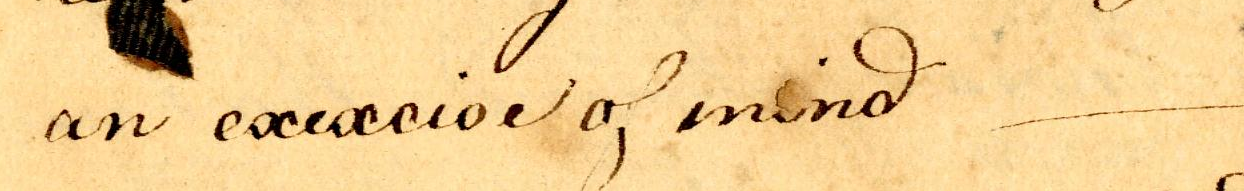an exexcise of mind-
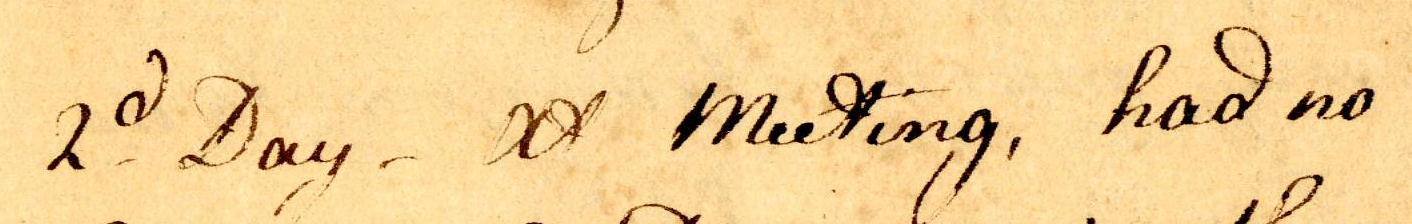2^d Day- At Meeting, had no
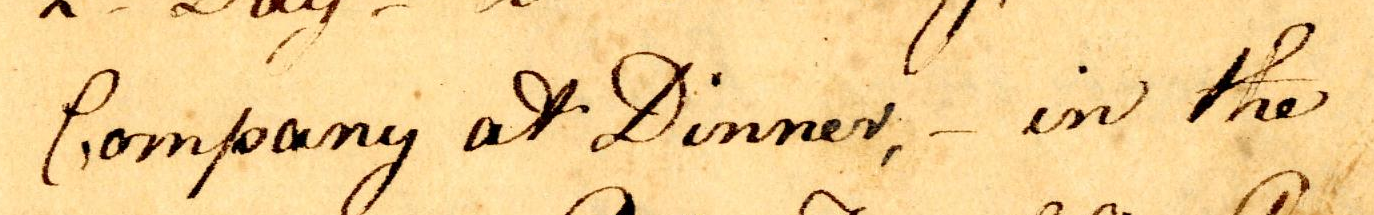Company at Dinner,- in the
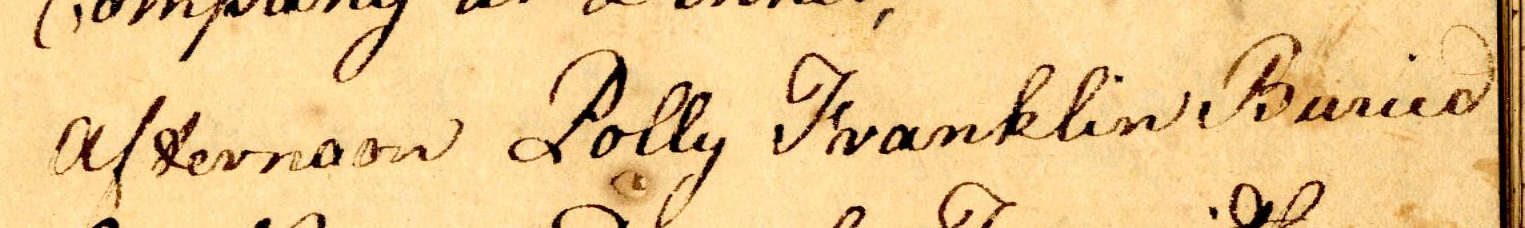Afternoon Polly Franklin Buried
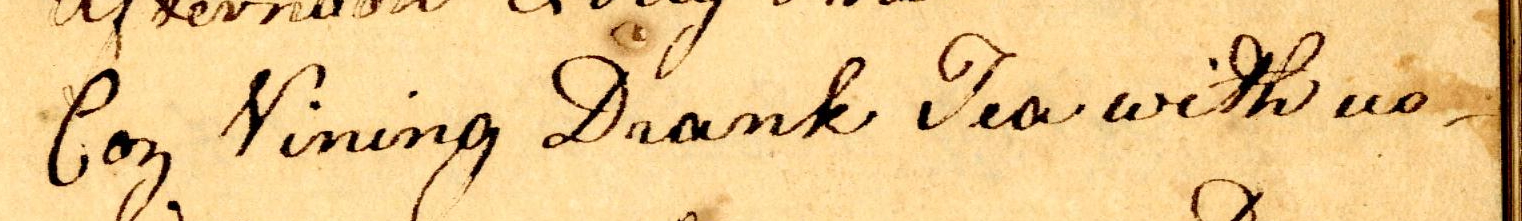Coz Vining Drank Tea with us-
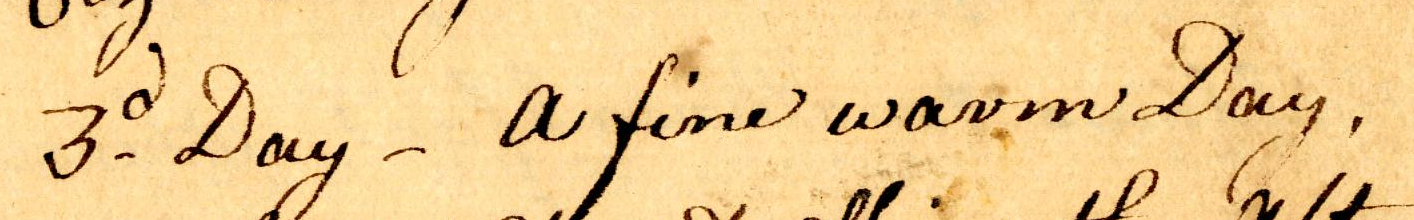3^d. Day- A fine warm Day,
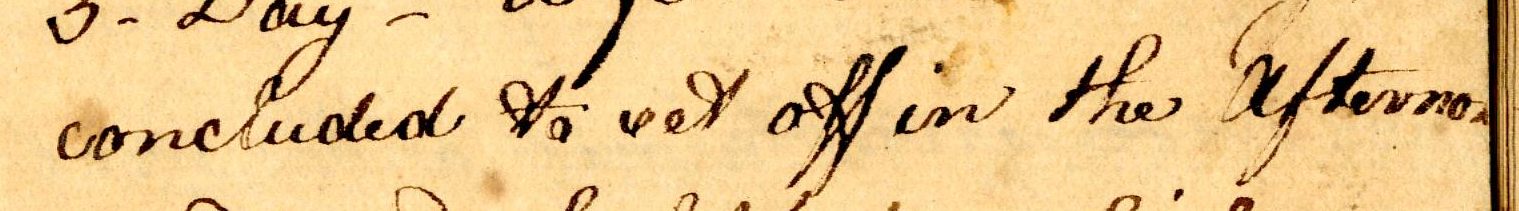concluded to set off in the Afterno
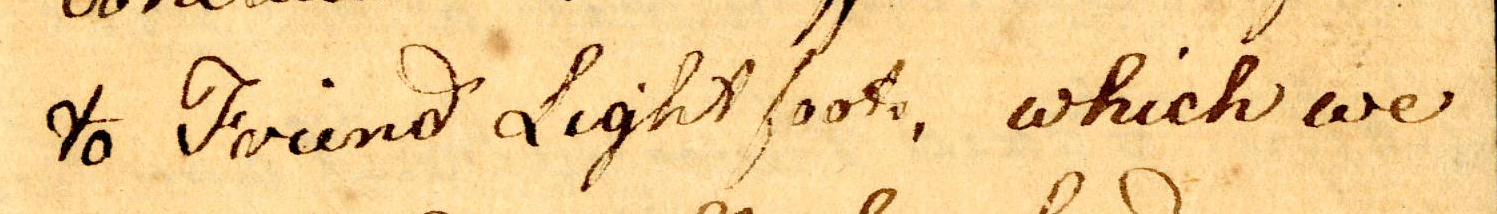to Friend Lightfoots, which we
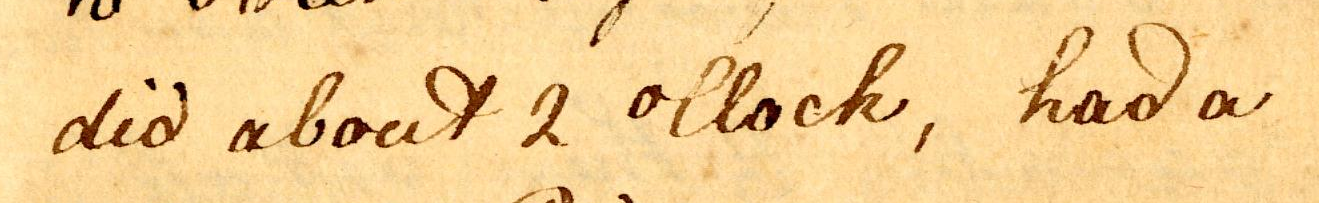did about 2 ^oClock, had a
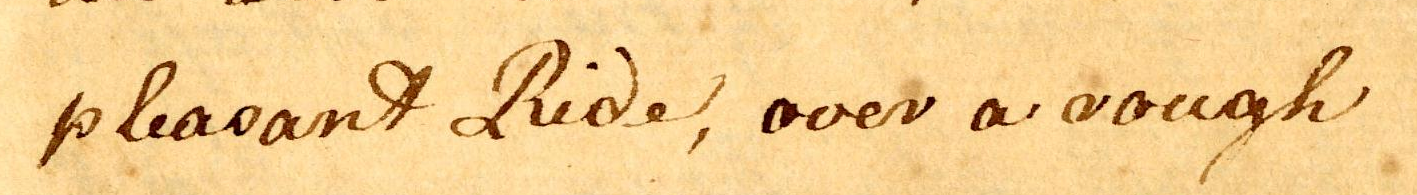pleasant Ride, over a rough
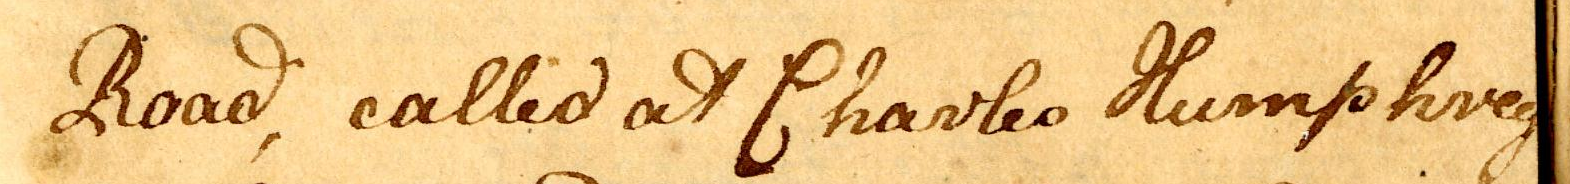Road, called at Charles Humphrey
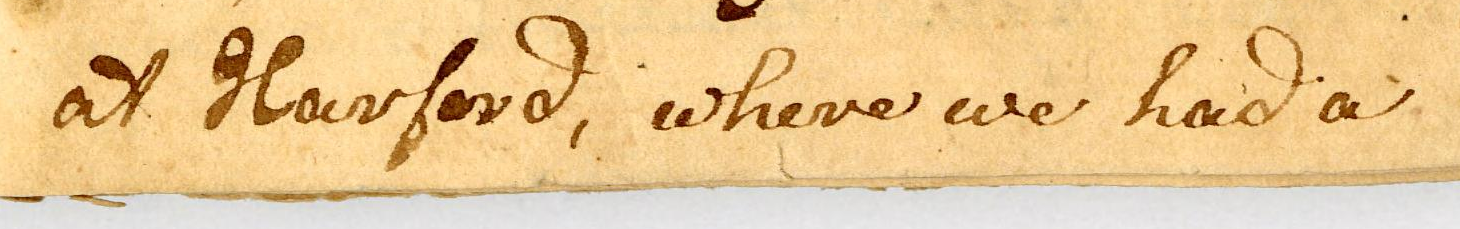at Harford, where we had a
